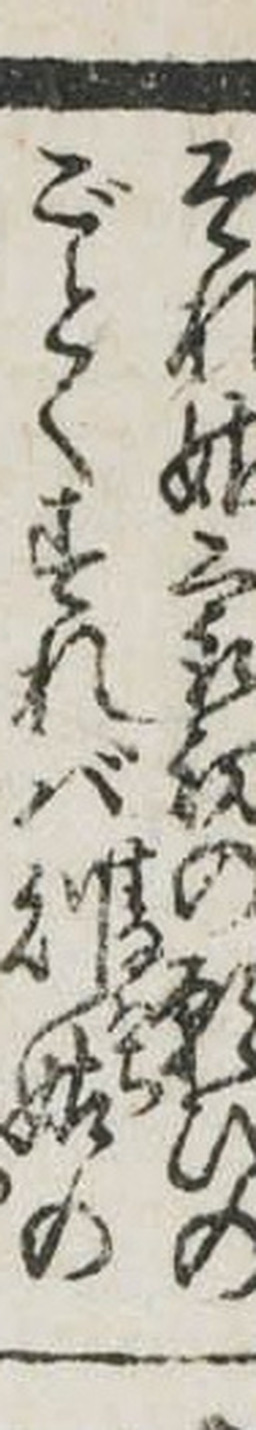ごとくすれば則姑の
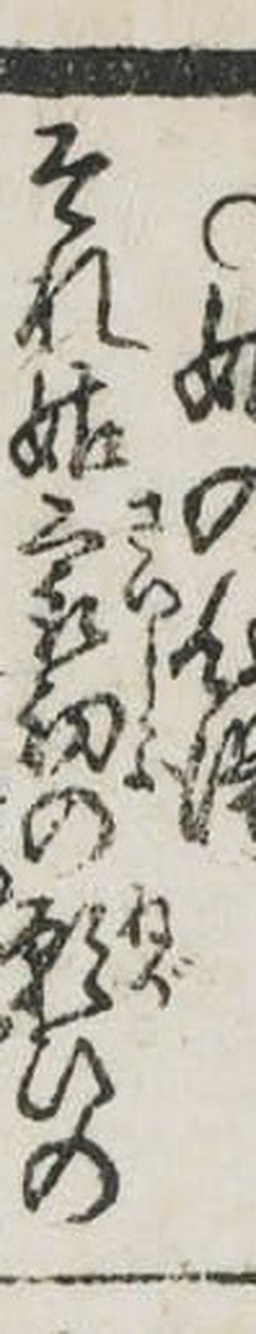それ姑最初の願ひの
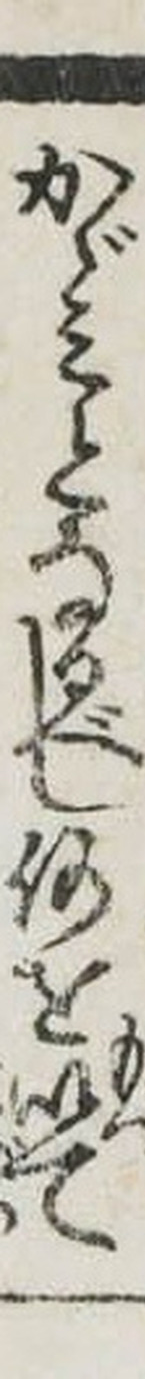かゞみとなるべし何を以て
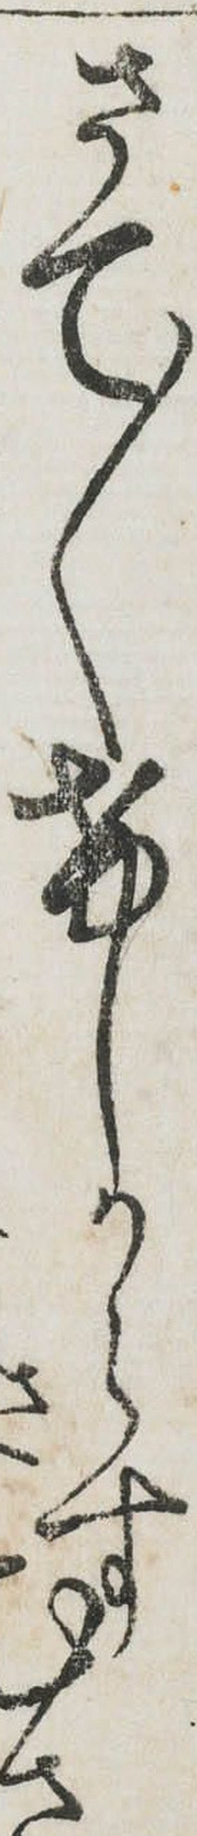さて〳〵けしからすさむさ
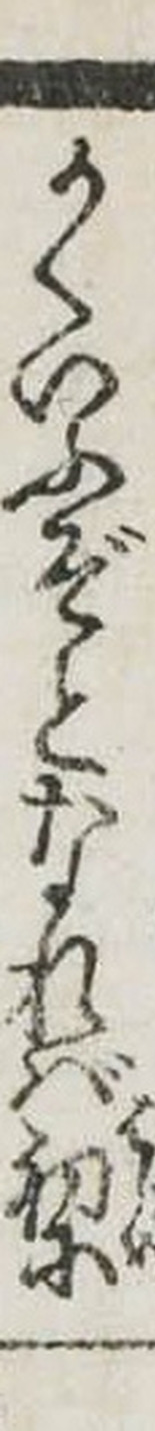かくいふぞとなれば初に
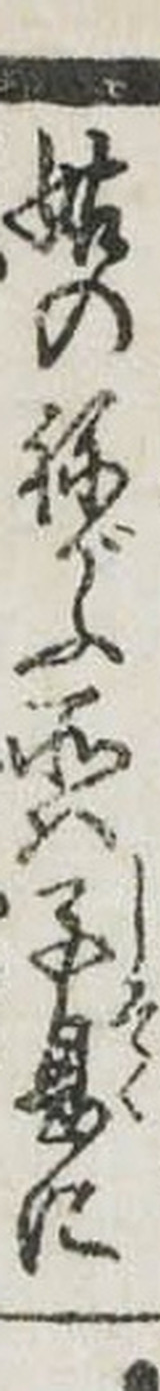姑のねがふ所は子息に
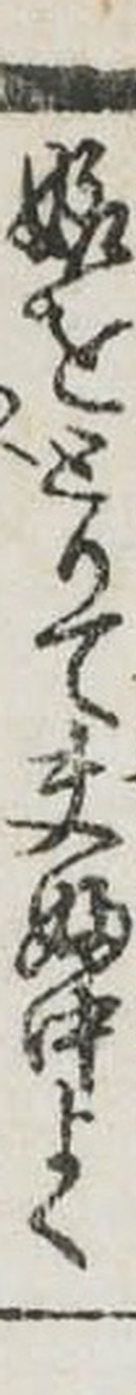娵をとりて夫婦中よく
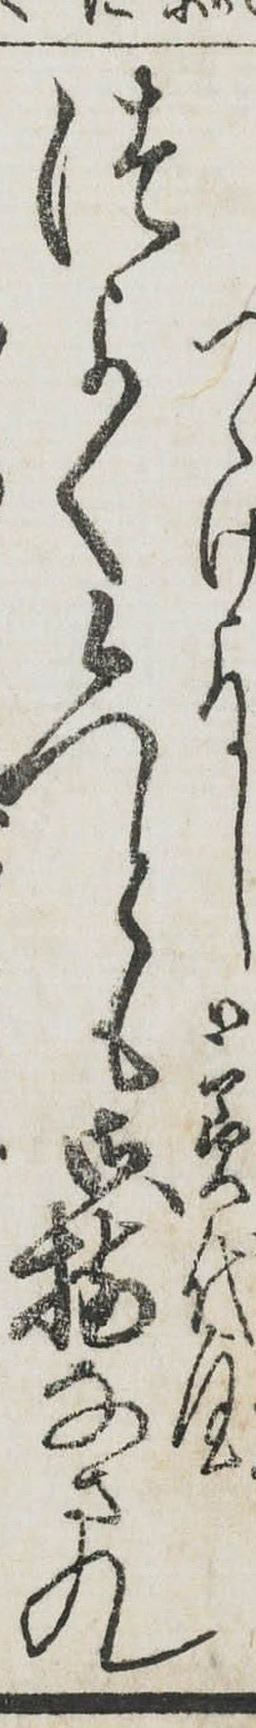つよく候へとも御揃なされ
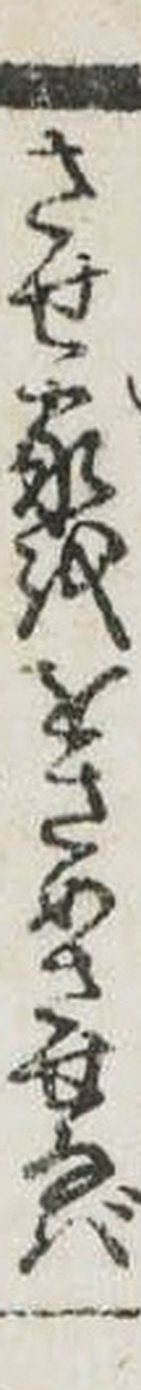させ家をおさめさせなば
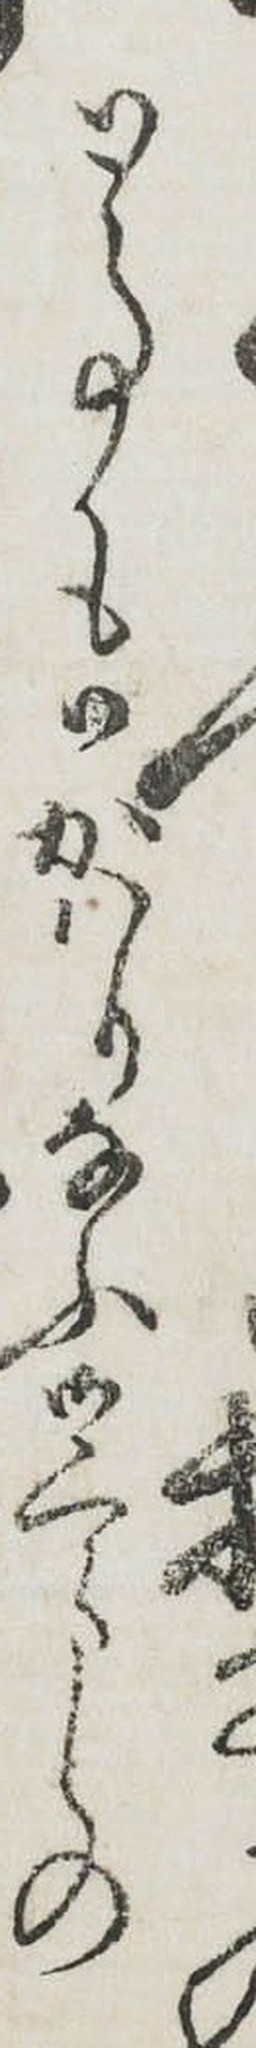御事も御かはりなふ御くらしの
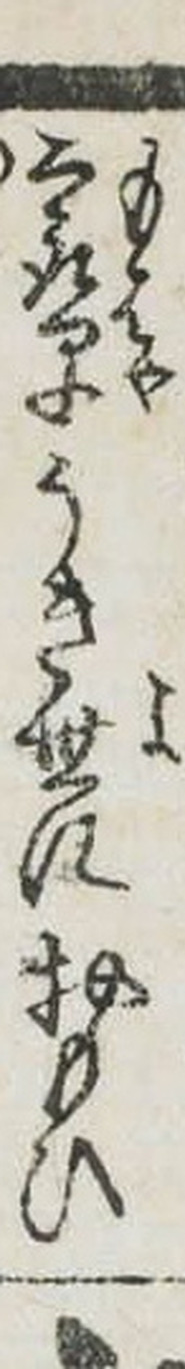最早うき世におもひ
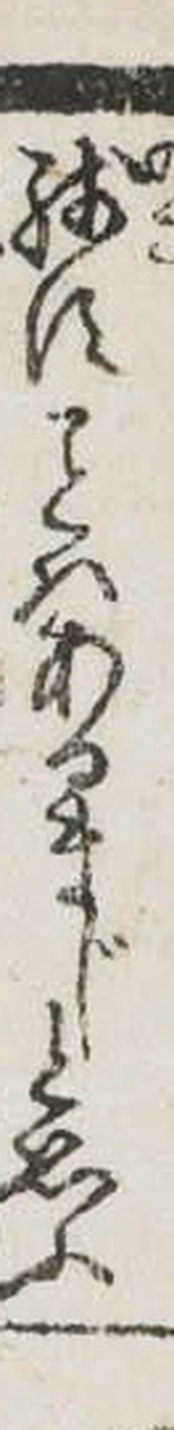残すことはあるまじと思ふ
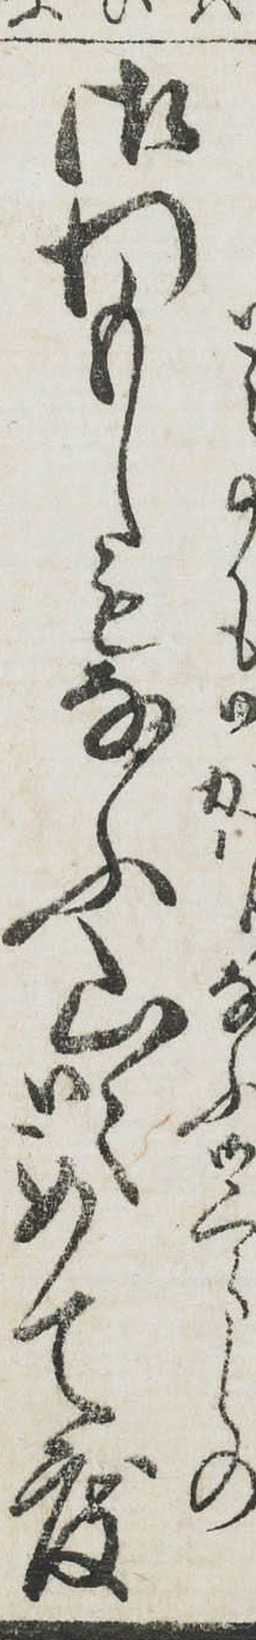御わもしもなふ山々御めて度
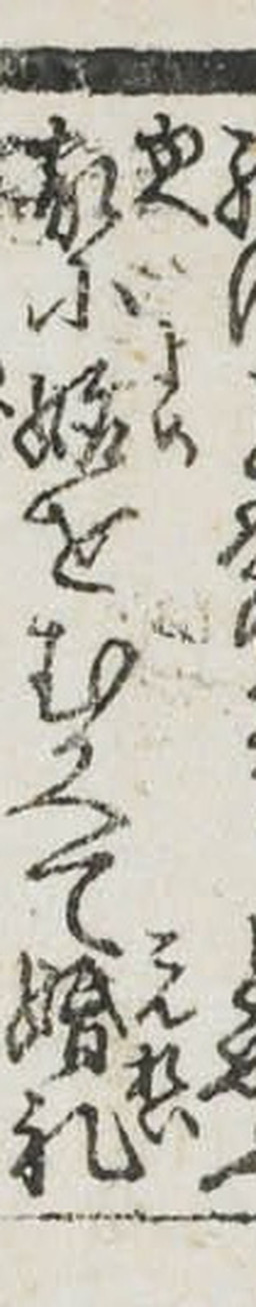故に娵をむかへて婚礼
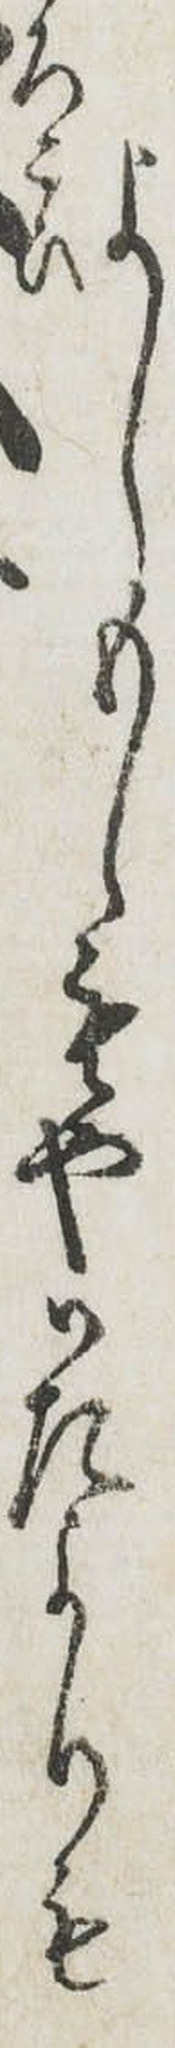よしもしもや御たよりも
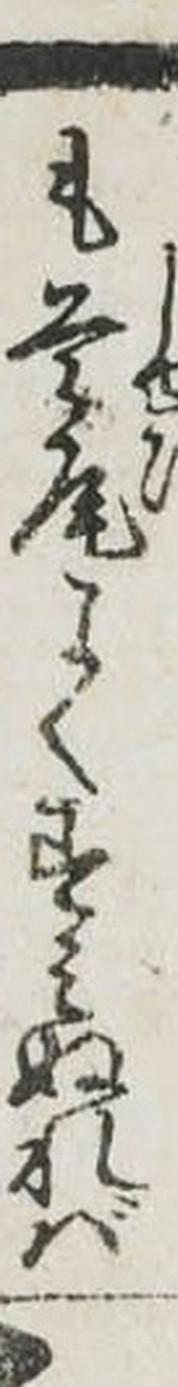も首尾よくすみぬれば
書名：頭書萬用婦人手紙之文言
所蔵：東京学芸大学教育コンテンツアーカイブ
